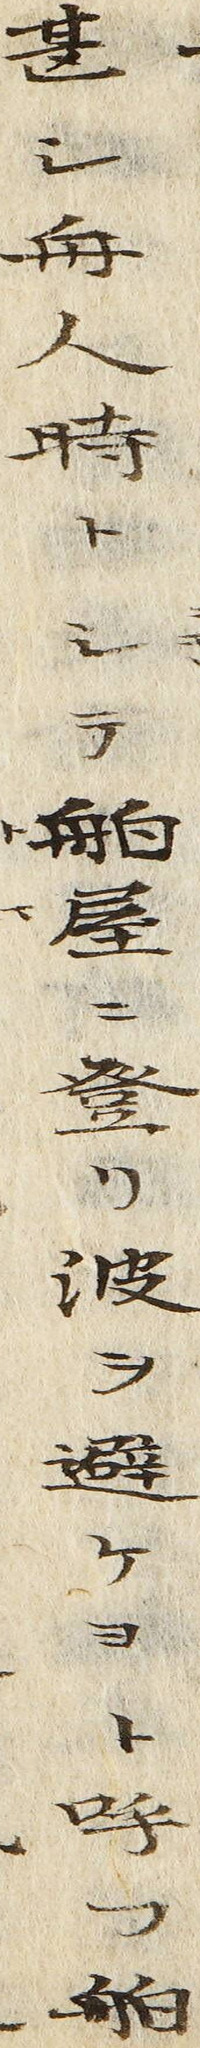甚シ舟人時トシテ舶屋ニ登リ波ヲ避ケヨト呼フ舶
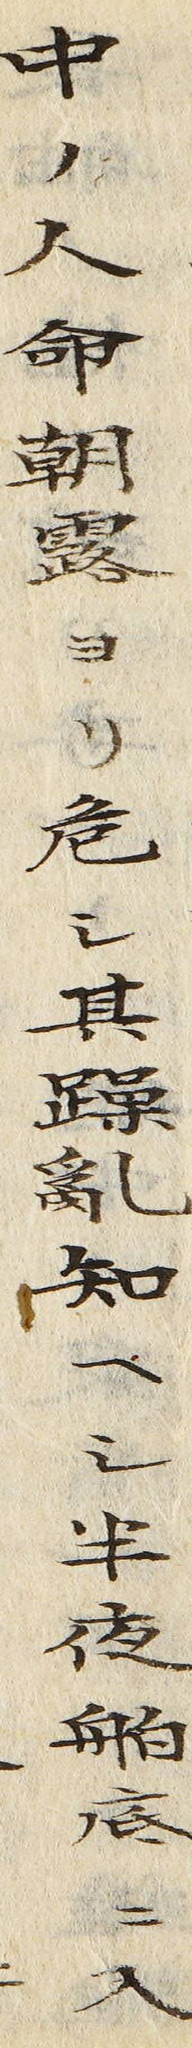中ノ人命朝露ヨリ危シ其躁乱知ヘシ半夜舶底ニ入
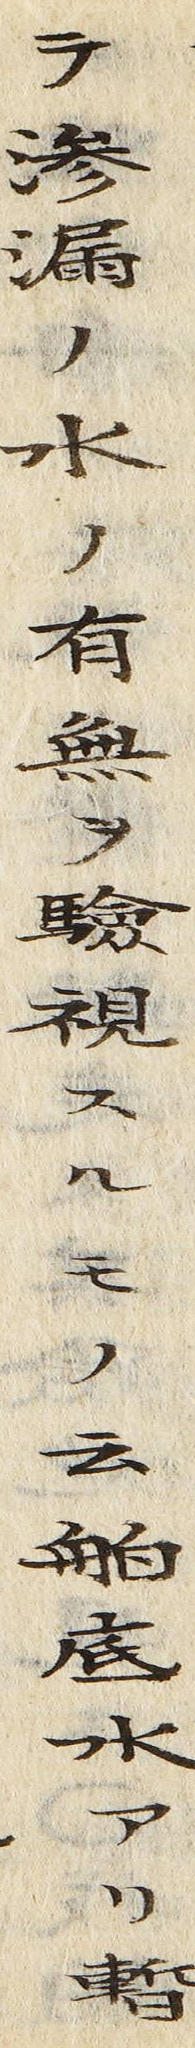テ滲漏ノ水ノ有無ヲ験視スルモノ云舶底水アリ暫
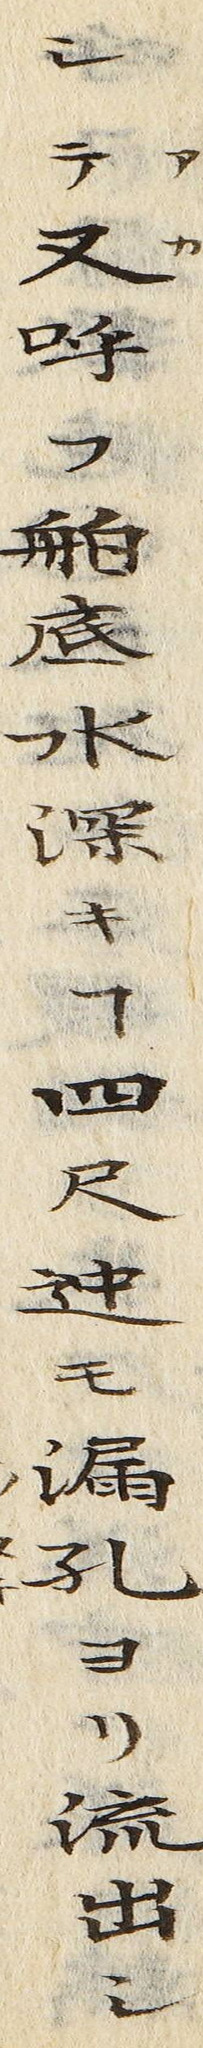シテ又呼フ舶底水深キコト四尺迚モ漏孔ヨリ流出シ
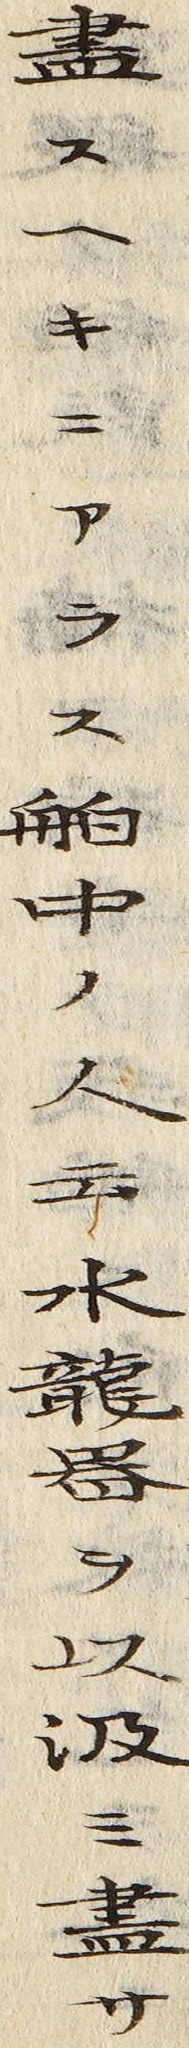尽スヘキニアラス舶中ノ人云水龍器ヲ以汲ミ尽サ
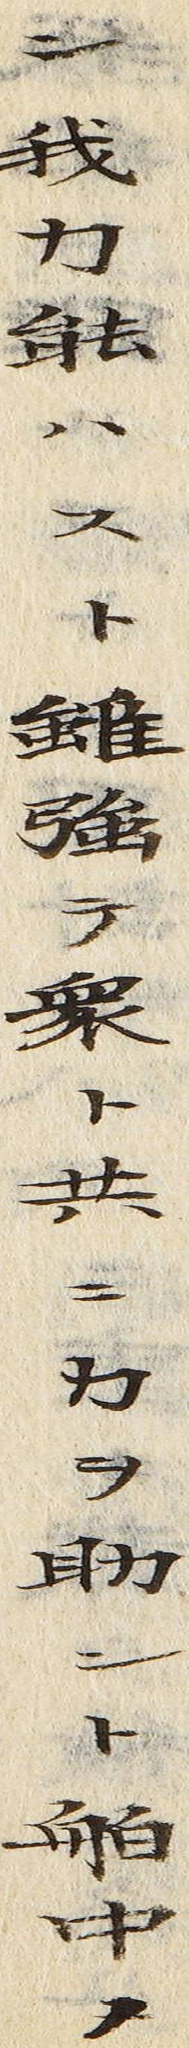ン我力能ハスト雖強テ衆ト共ニ力ヲ助ント舶中ノ
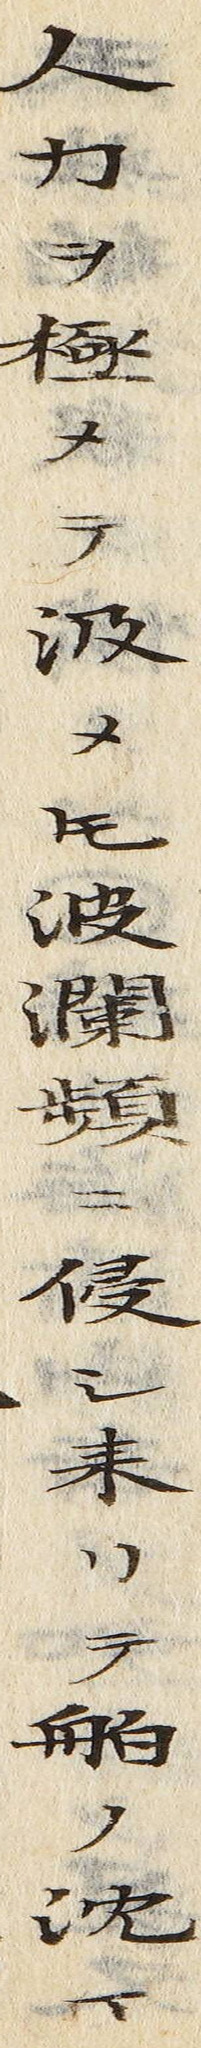人力ヲ極メテ汲メ𪜈波瀾頻ニ侵シ来リテ舶ノ沈マ
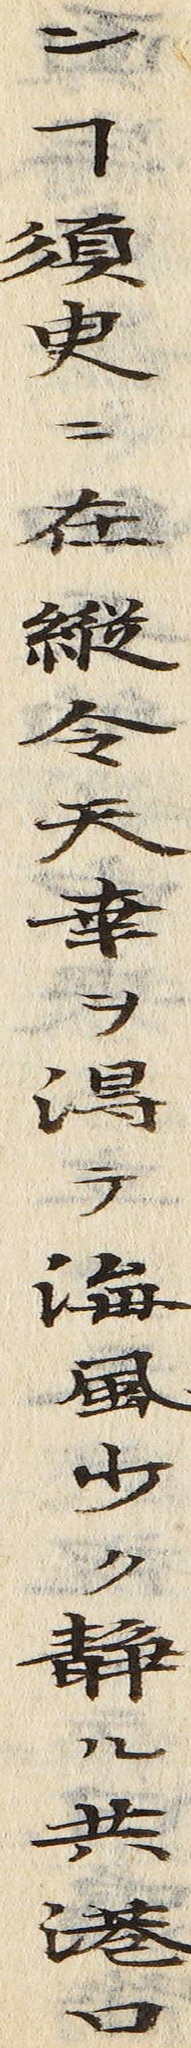ンコト須臾ニ在縦令天幸ヲ得テ海風少ク静ル共港口
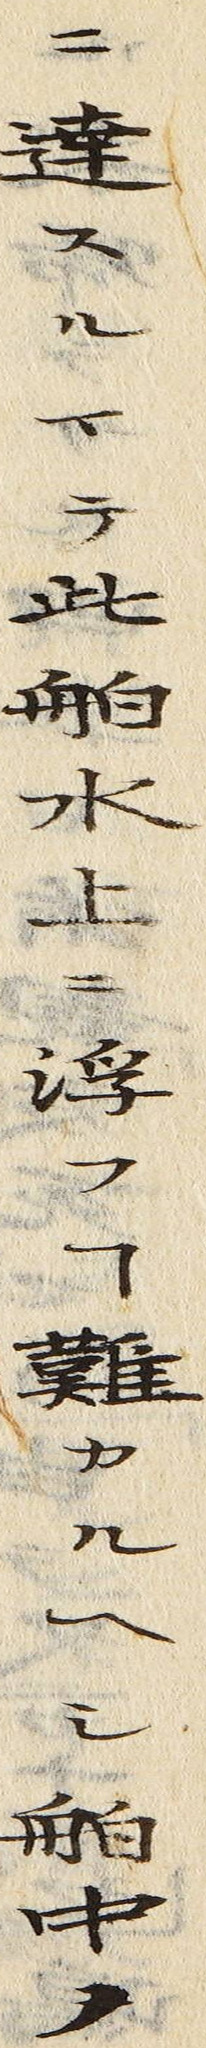ニ達スルマテ此舶水上ニ浮フコト難カルヘシ舶中ノ
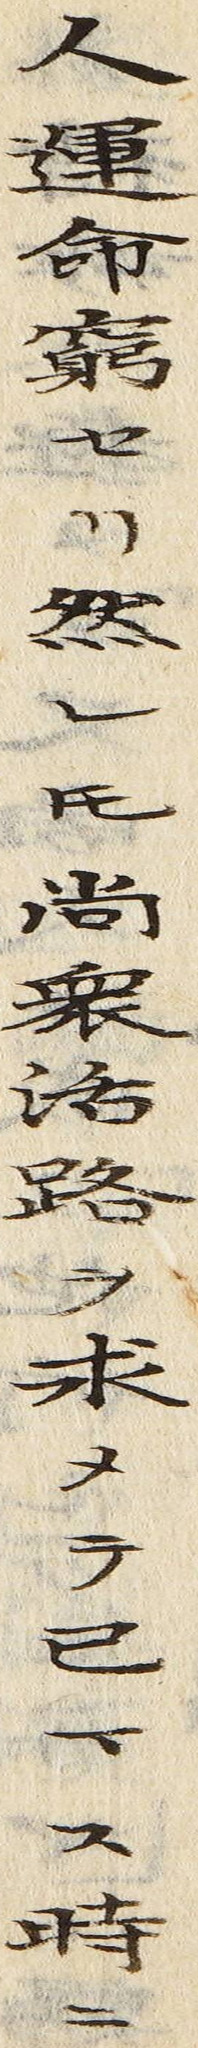人運命窮セリ然レトモ尚衆活路ヲ求メテ已マス時ニ
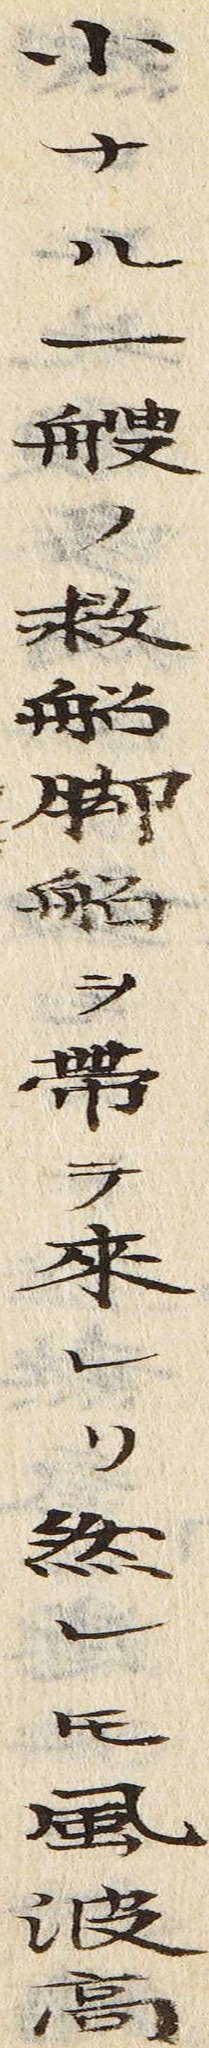小ナル一艘ノ救船脚船ヲ帯テ来レリ然レトモ風波高
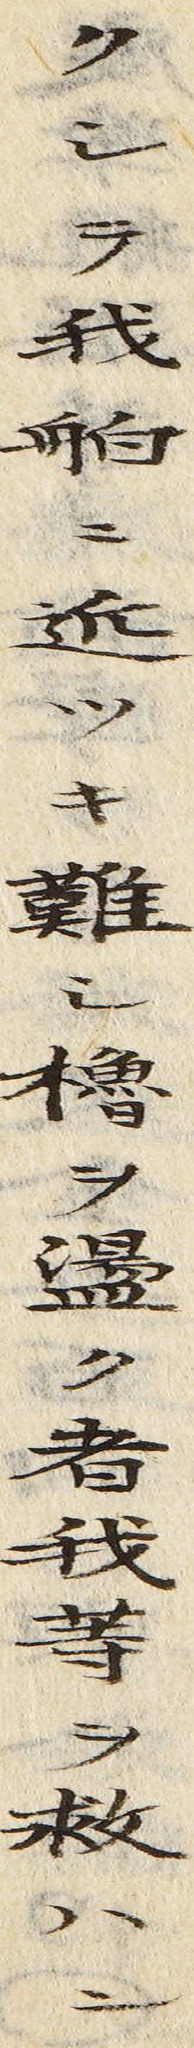クシテ我舶に近ツキ難シ櫓ヲ盪ク者我等ヲ救ハン
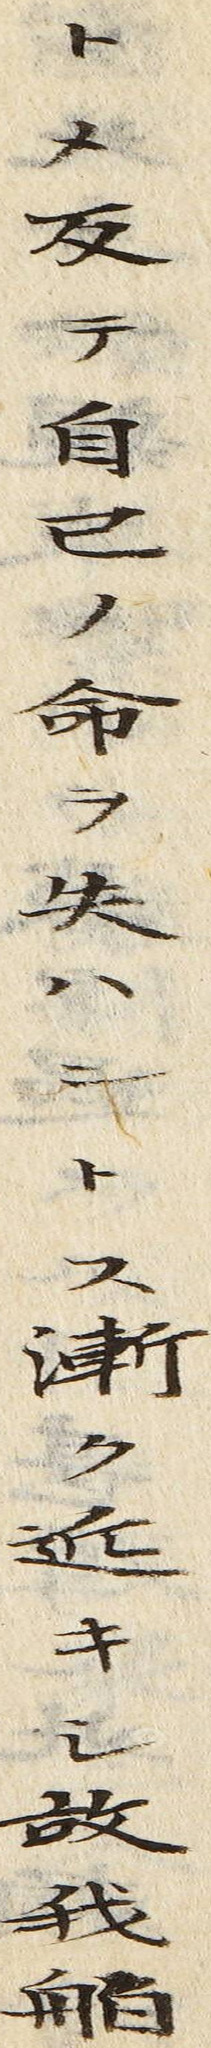トシテ反テ自己ノ命ヲ失ハントス漸ク近キシ故我舶
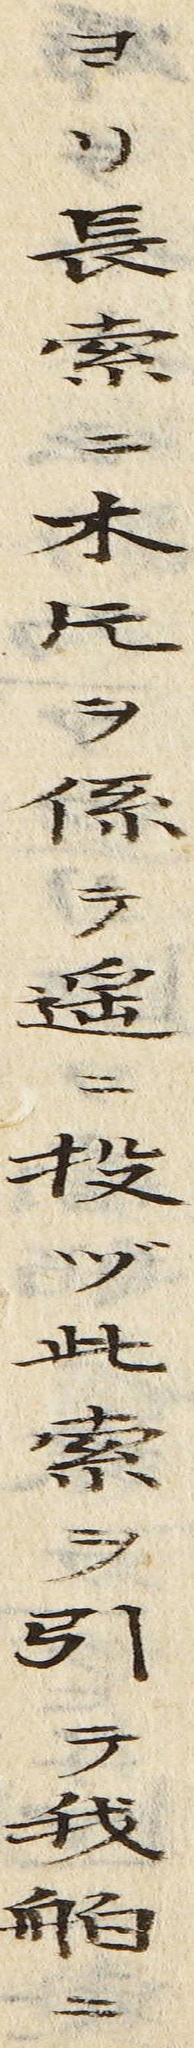ヨリ長索ニ木トモヲ係テ遙ニ投ヅ此索ヲ引テ我舶ニ
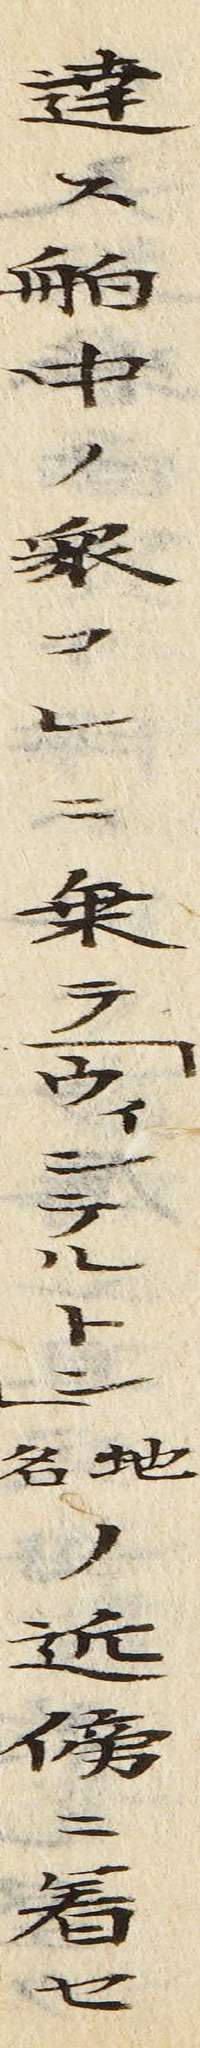達ス舶中ノ衆コレニ乗テ「ウインテルトン」地名ノ近傍ニ着セ
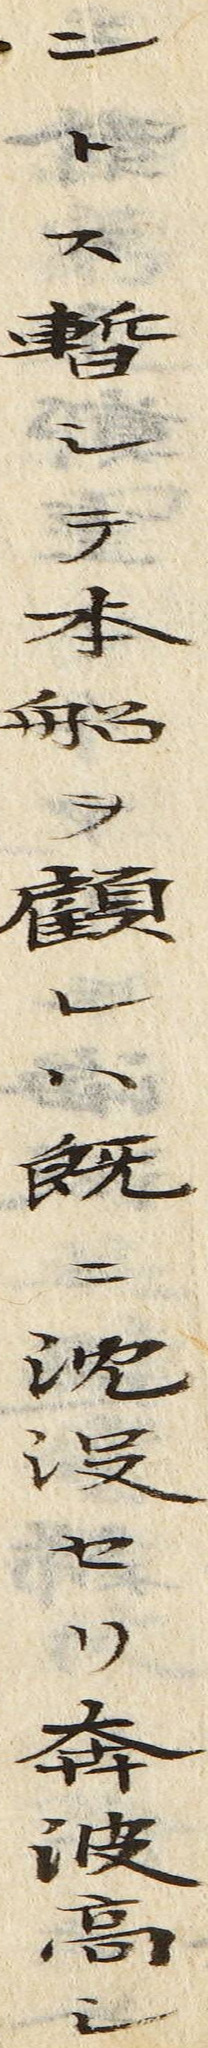ントス暫シテ本船ヲ顧レハ既ニ沈浸セリ奔波高シ
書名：漂流紀事
